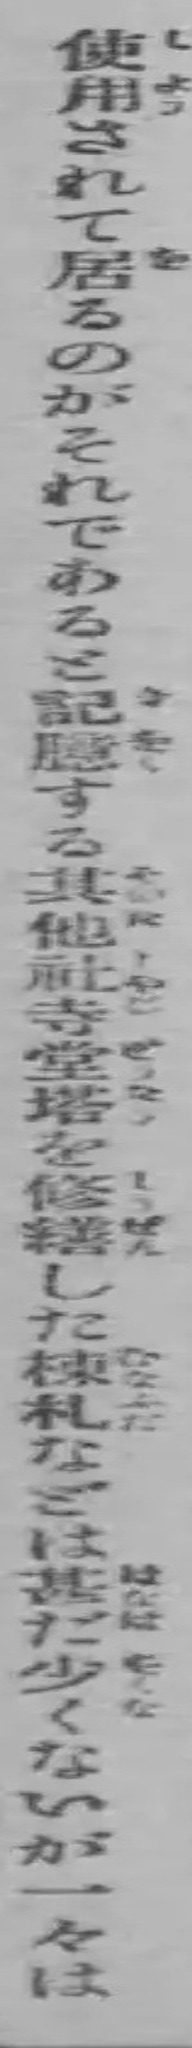使用されて居るのがそれであると記臆する其他社寺堂塔を修繕した棟札などは甚だ少くないが一々は

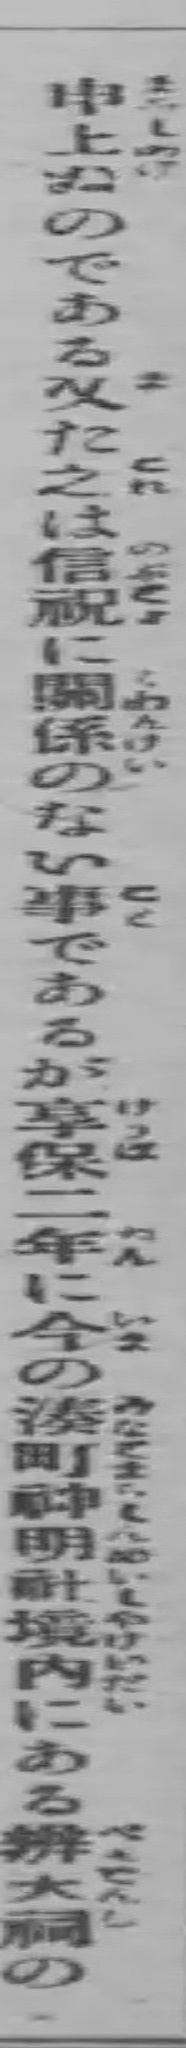申上ぬのである又た之は信祝に関係のない事であるが享保二年に今の湊町神明社境内にある弁天祠の
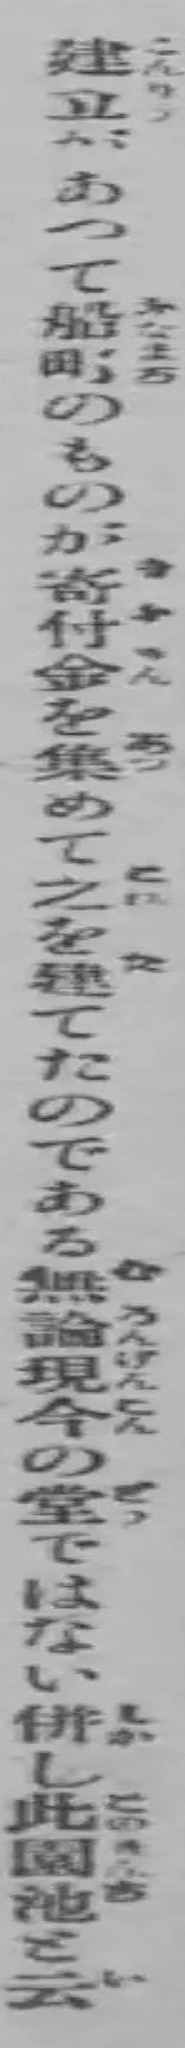建立があつて船町のものが寄付金を集めて之を建てたのである無論現今の堂ではない併し此園池と云
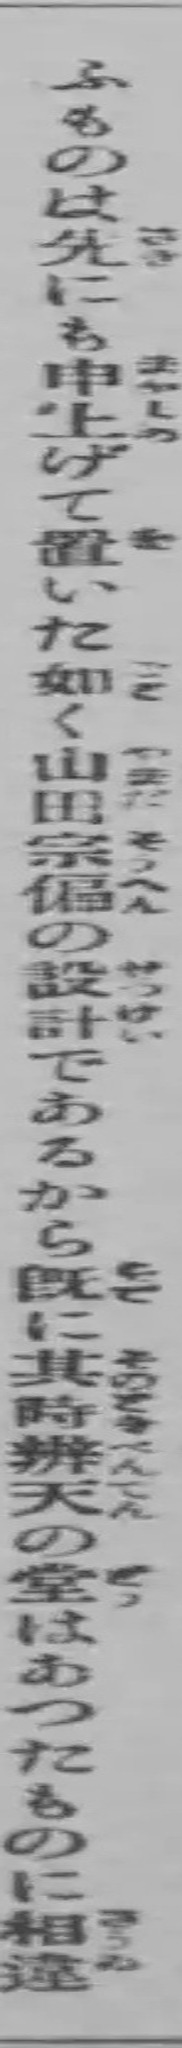ふものは先にも申上げて置いた如く山田宗偏の設計であるから既に其時弁天の堂はあつたものに相違
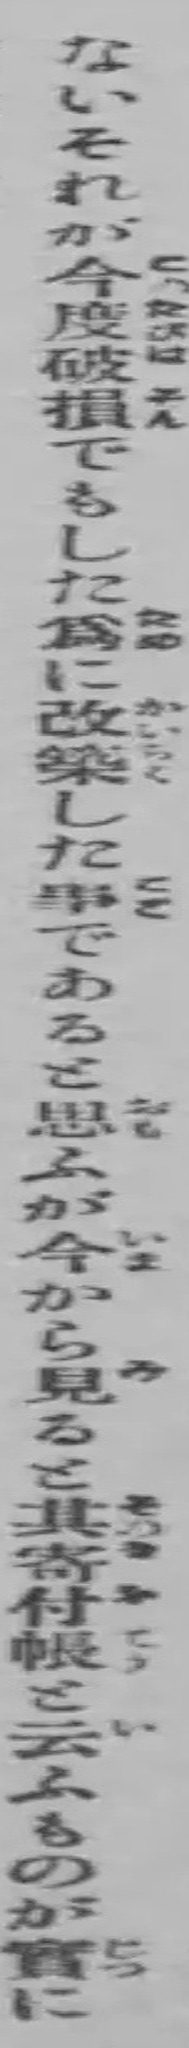ないそれが今度破損でもした為に改築した事であると思ふが今から見ると其寄付帳と云ふものが実に
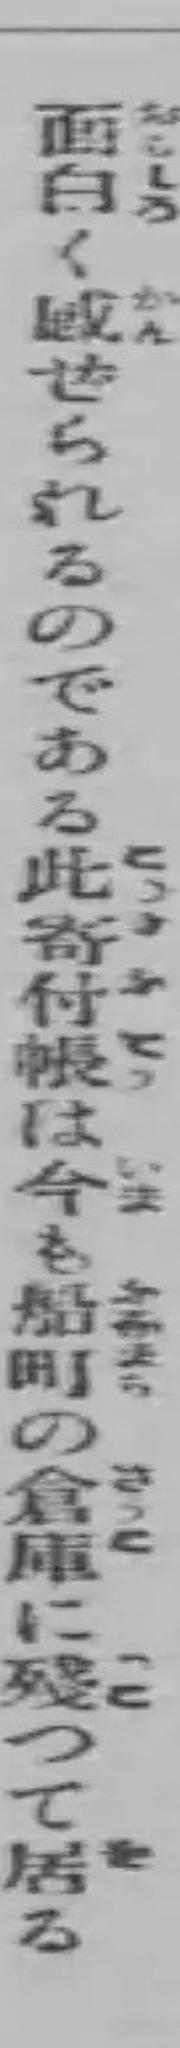面白く感ぜられるのである此寄付帳は今も船町の倉庫に残つて居る
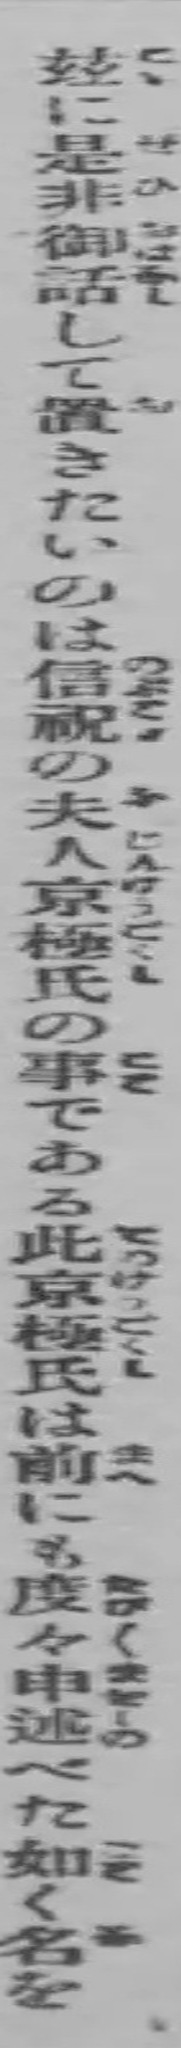茲に是非御話して置きたいのは信祝の夫人京極氏の事である此京極氏は前にも度々申述べた如く名を
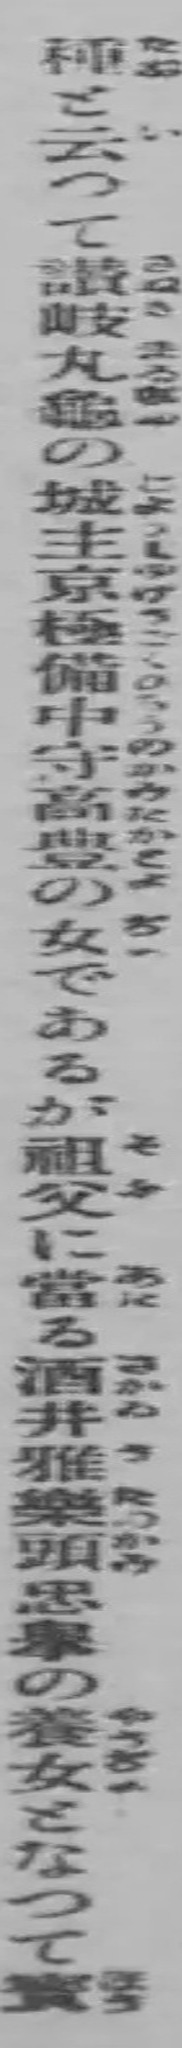種と云つて讃岐丸亀の城主京極備中守高豊の女であるが祖父に当る酒井雅樂守忠挙の養女となつて宝
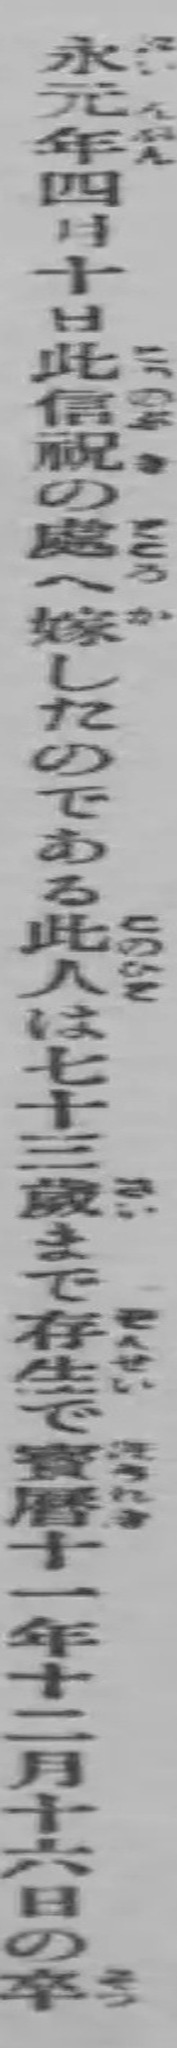永元年四月十日此信祝の処へ嫁したのである此人は七十三歳まで存生で宝暦十一年十二月十六日の卒
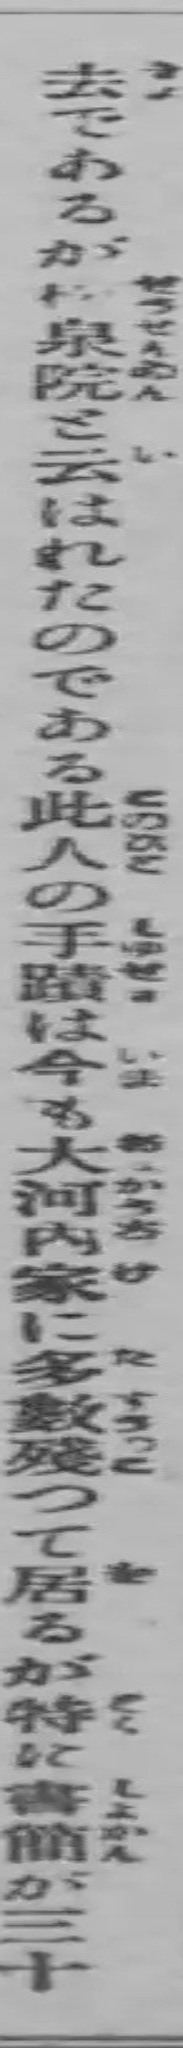去であるが松泉院と云はれたのである此人の手蹟は今も大河内家に多数残つて居るが特に書簡が三十
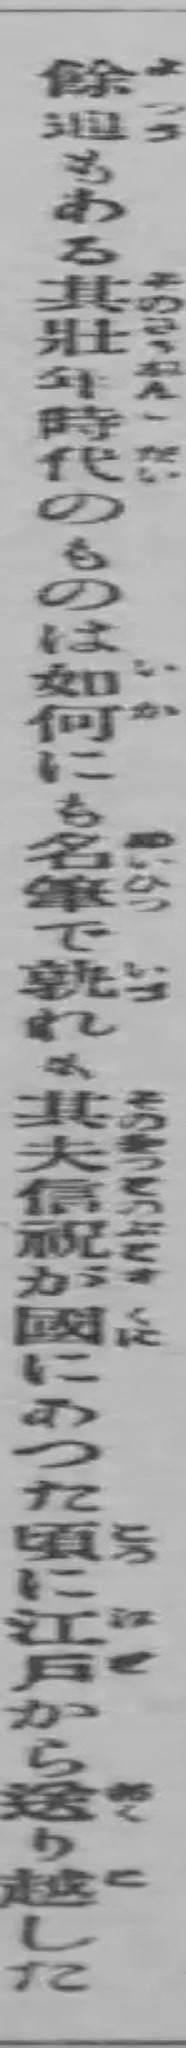余通もある其壮年時代のものは如何にも名筆で孰れも其夫信祝が国にあつた頃に江戸から送り越した
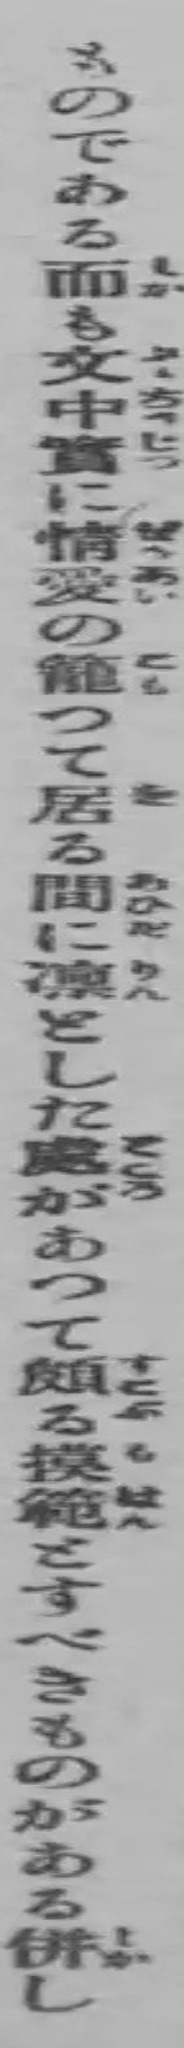ものである而も文中実に情愛の籠つつて居る間に凛とした処があつて頗る模範とすべきものがある併し
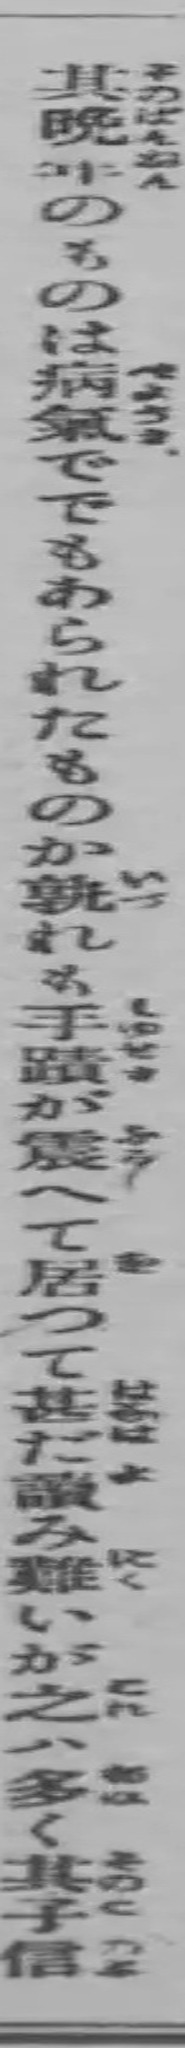其晩年のものは病気ででもあられたものか孰れも手蹟が震へて居つて甚だ読み難いが之は多く其子信
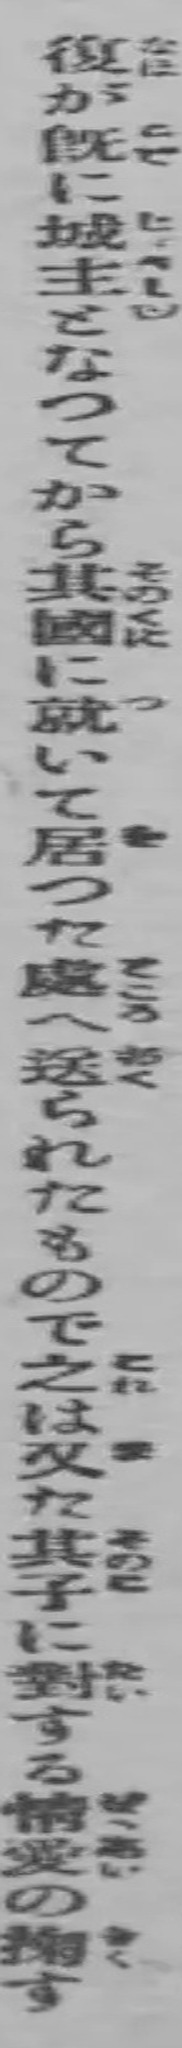復が既に城主となつてから其国に就いて居つた処へ送られたもので之は又た其子に対する情愛の掬す
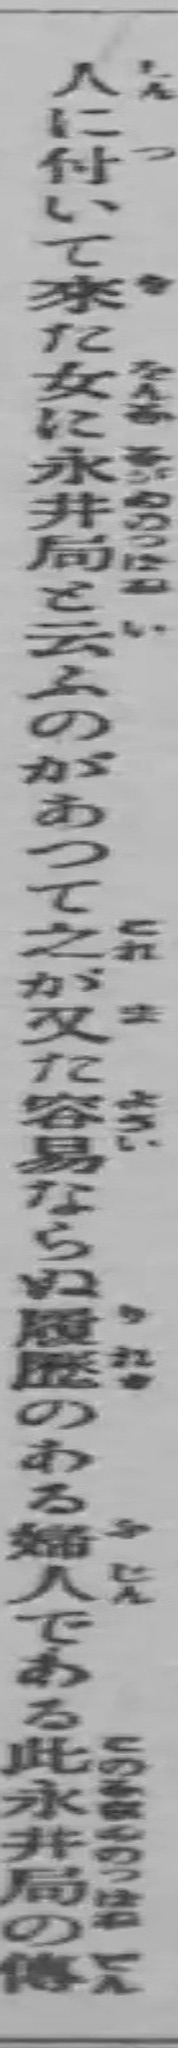人に付いて来た女に永井局と云ふのがあつて之が又た容易ならぬ履歴のある婦人である此永井局の伝
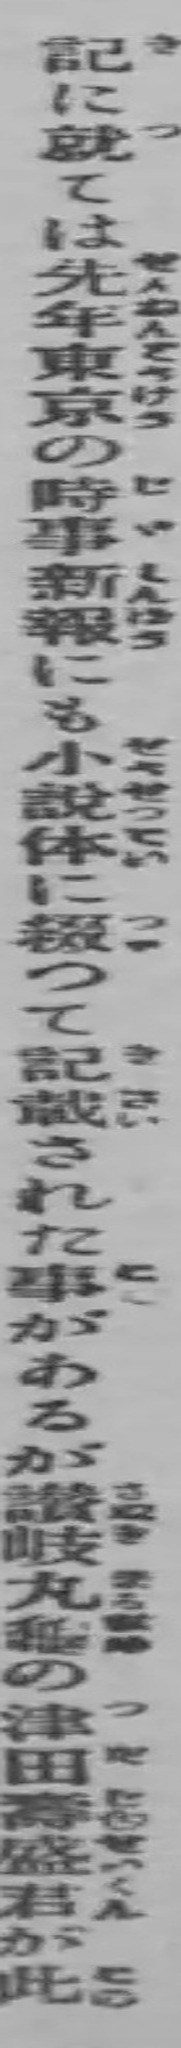記に就ては先年東京の時事新報にも小説体に綴つて記載された事があるが讃岐丸亀の津田壽盛君が此
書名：豊橋市史談
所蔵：国立国会図書館 National Diet Library, JAPAN
